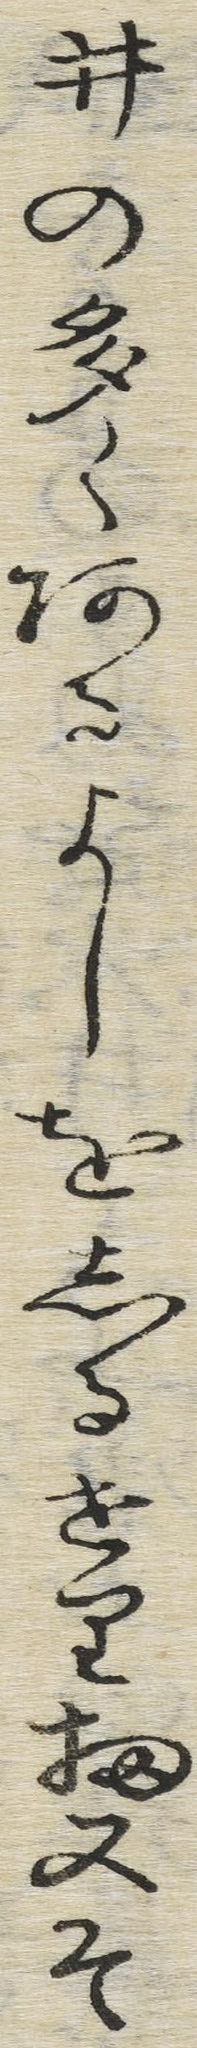井の多くあるよしをしるせり扨又そ
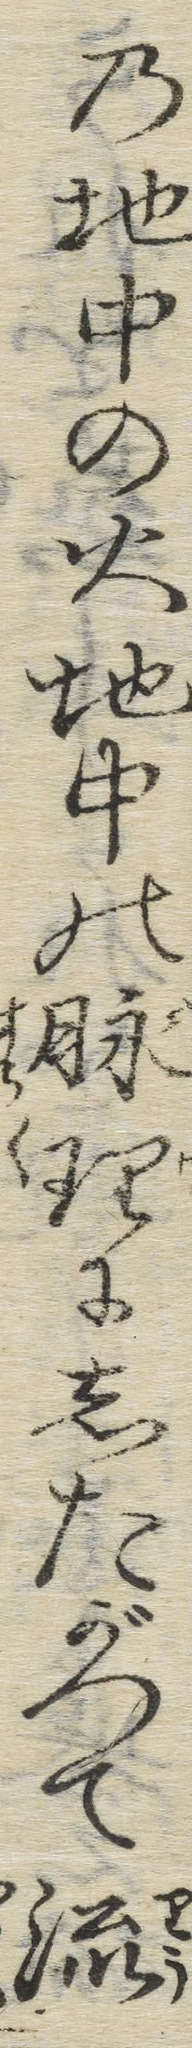の地中の火地中の脈理にしたがつて流
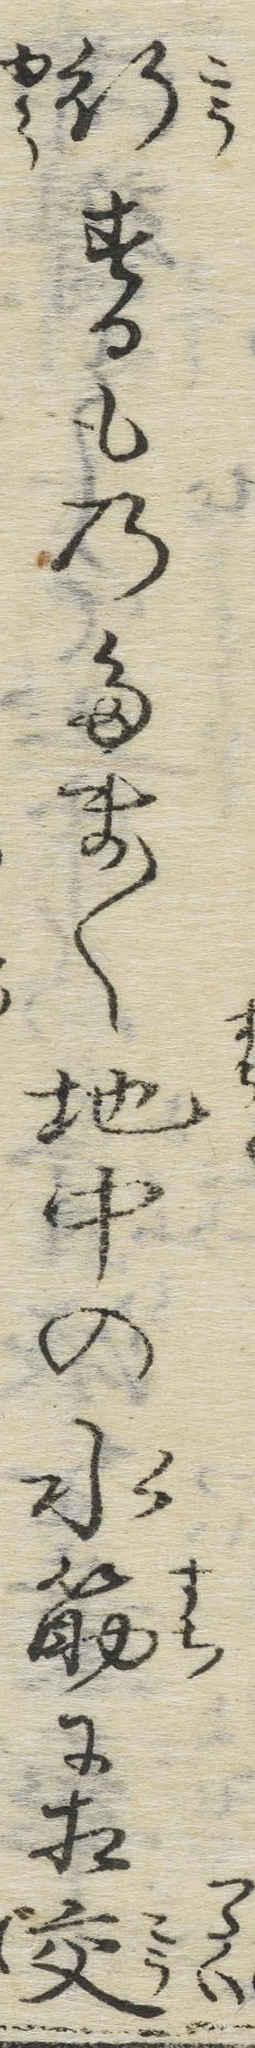行するものたま〳〵地中の水筋に出？交
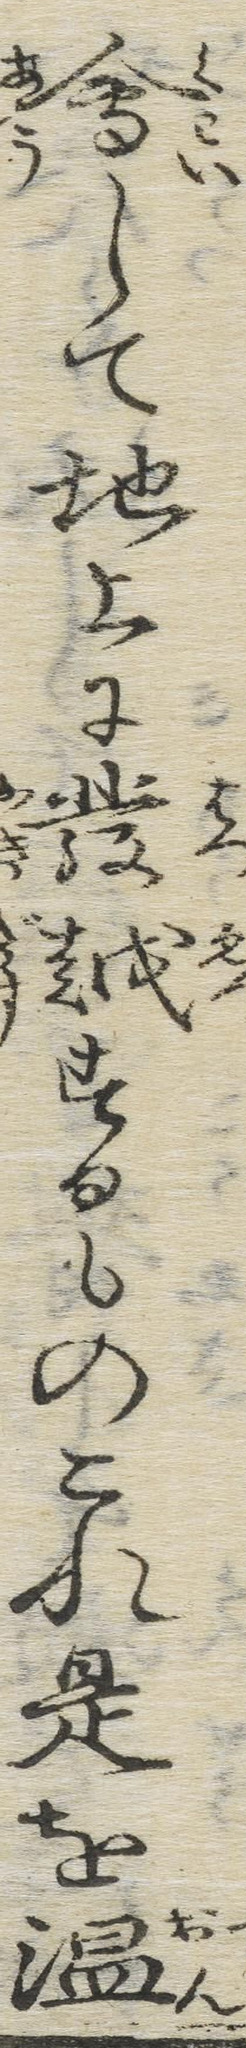会して地上に発越するものこれ是を温
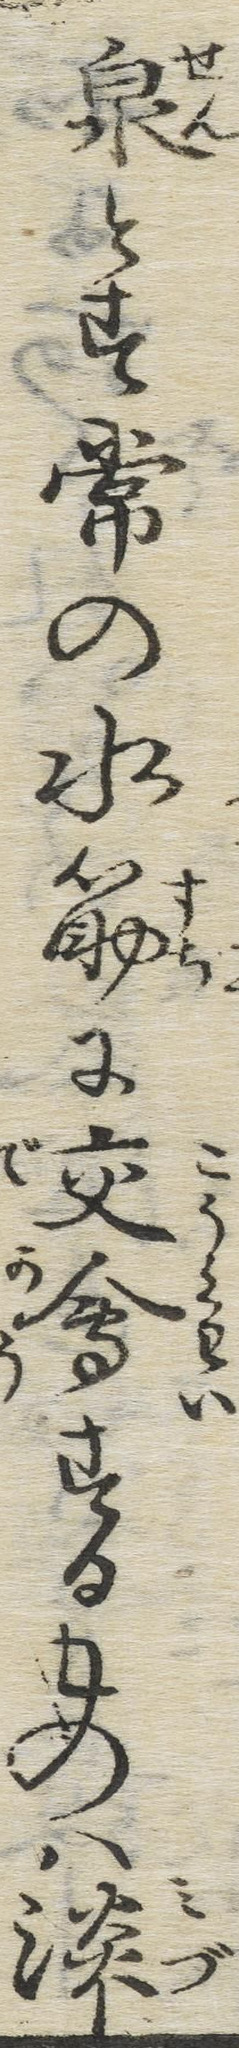泉とす常の水筋に交会するものは淡
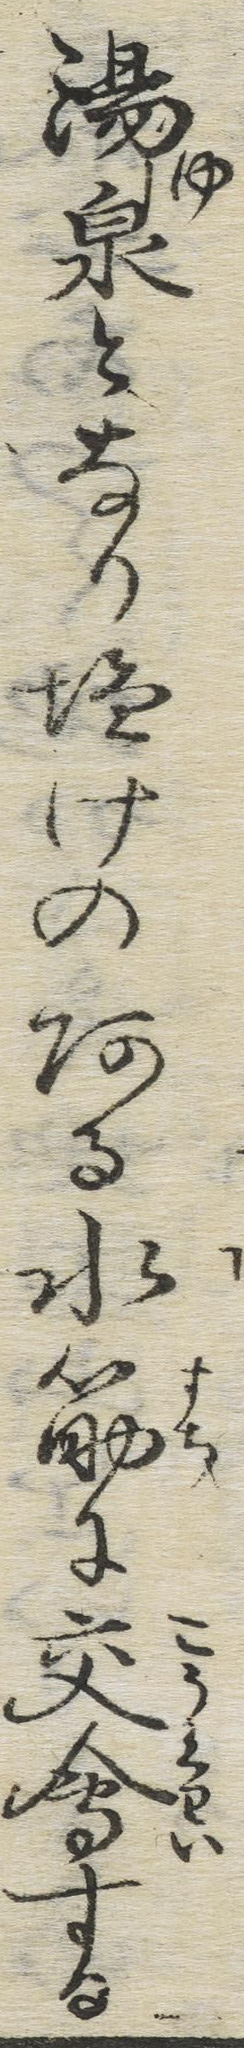湯泉となりつ塩けのある水筋に交会する
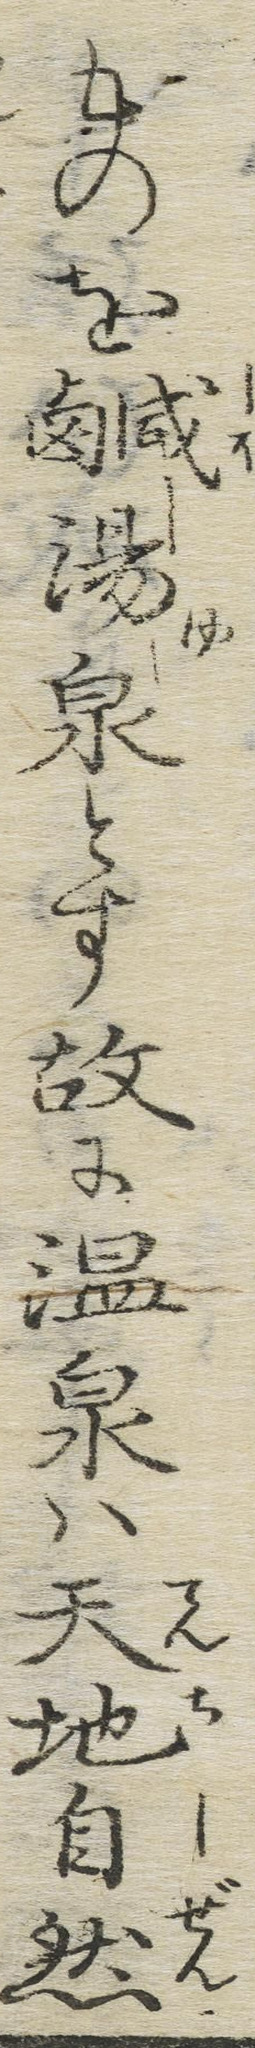もの鹹湯泉とす故に温泉は天地自然
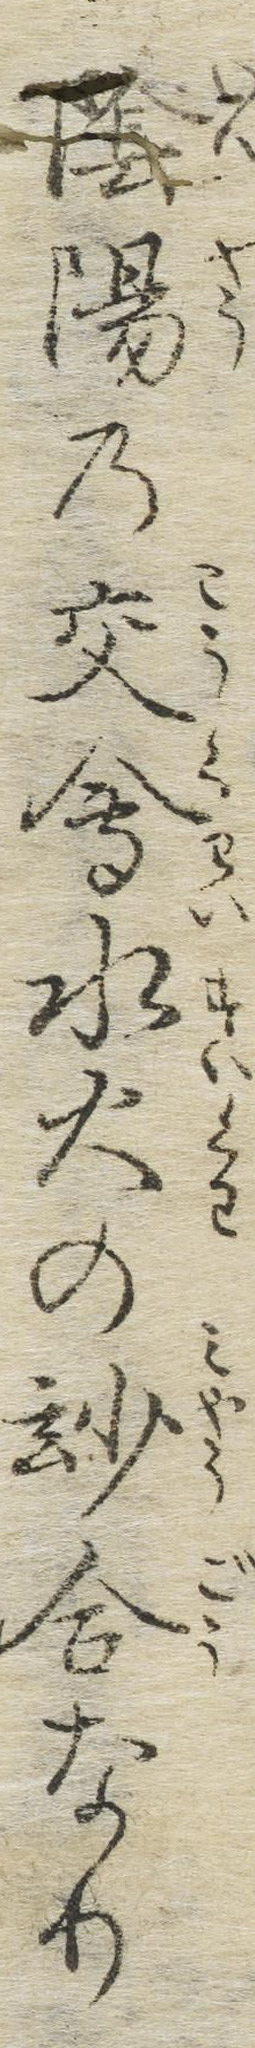陰陽の交会水火の妙合なり
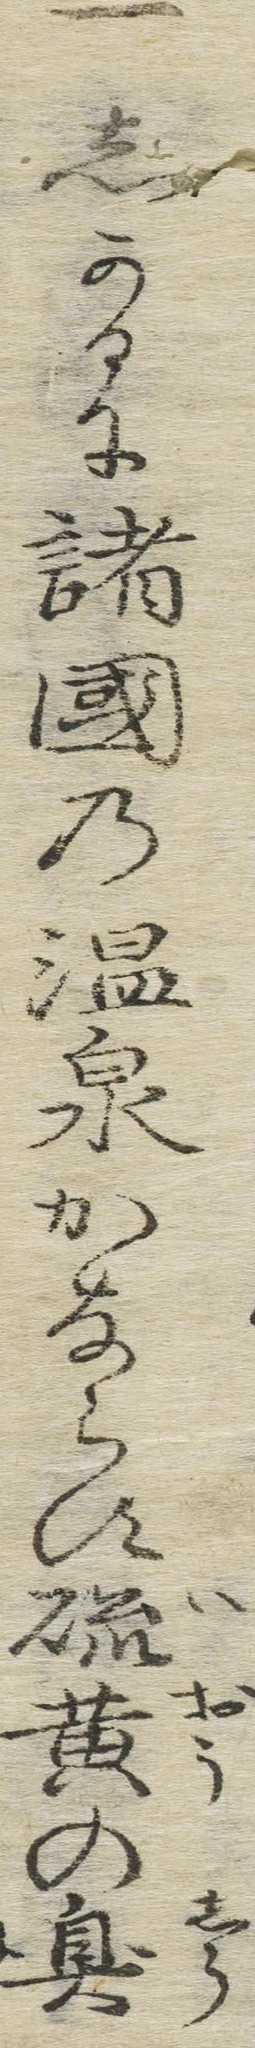一しかるに諸国の温泉かならす硫黄の臭

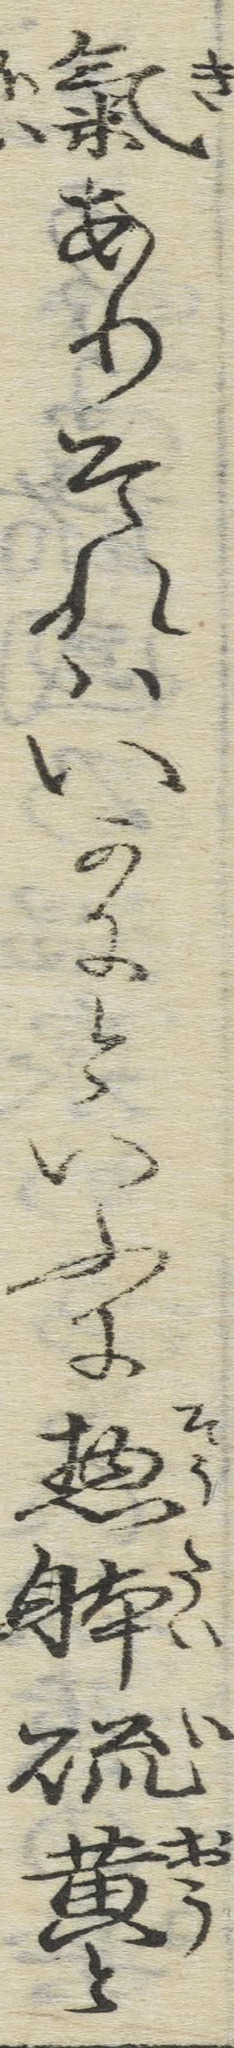気ありそれはいかにといふに総体硫黄と
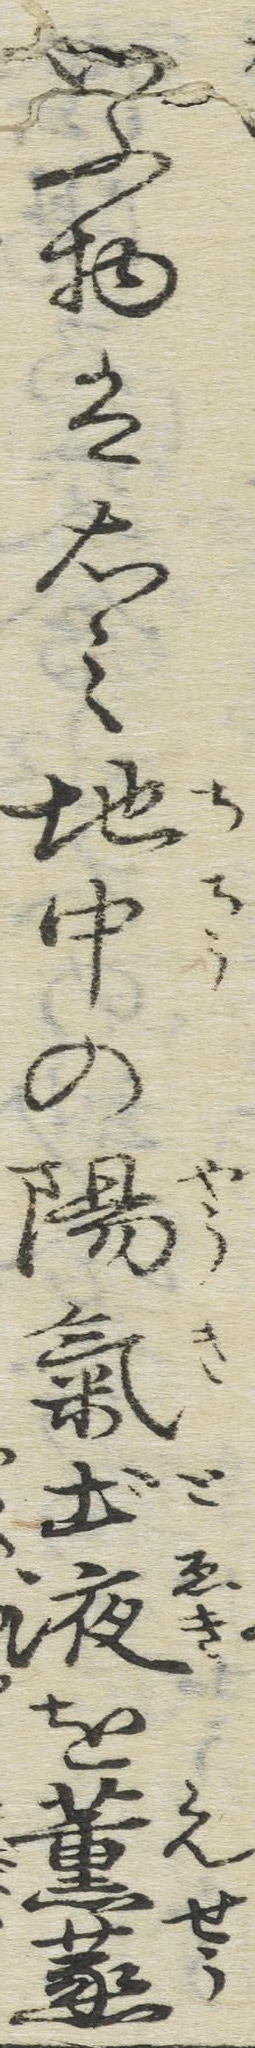いふ物は右の地中の陽気土液を薫蒸
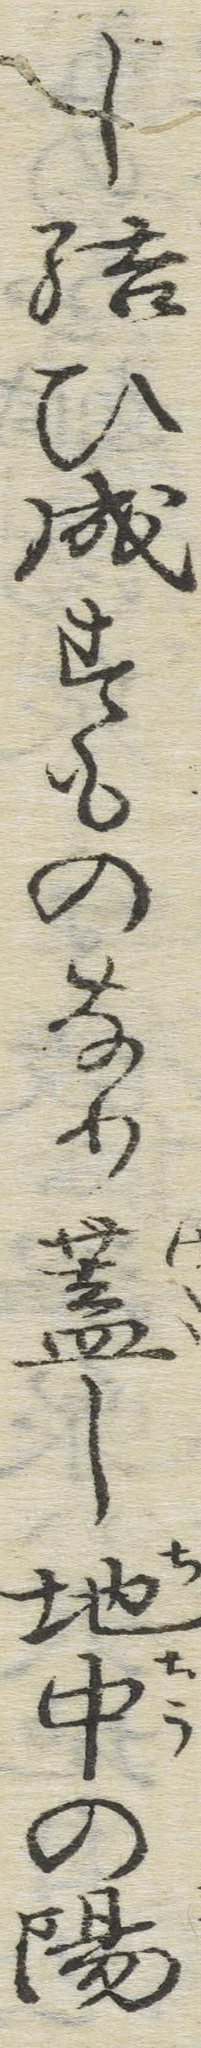し結ひ成すものなり蓋し地中の陽
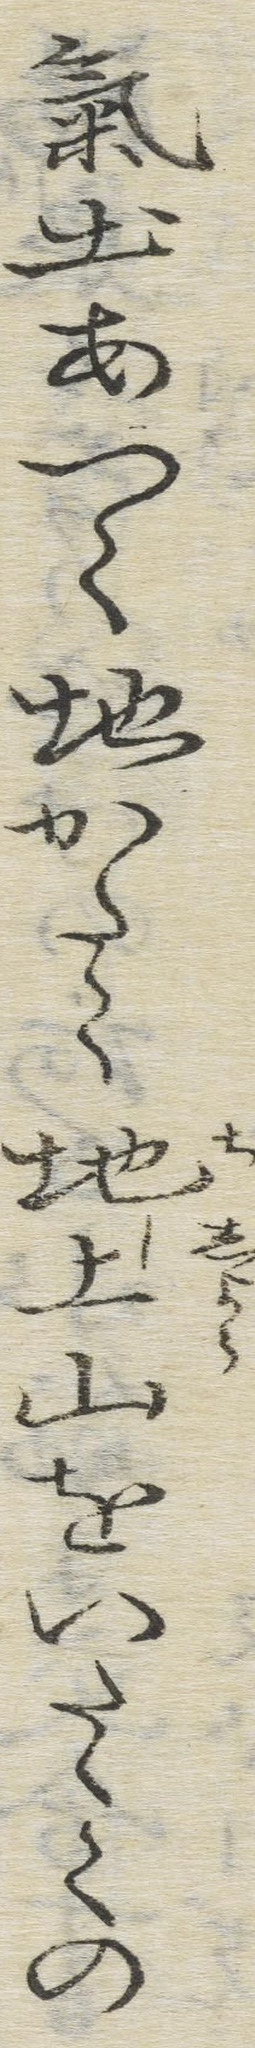気土あつく地かたく地上山をいたゝくの
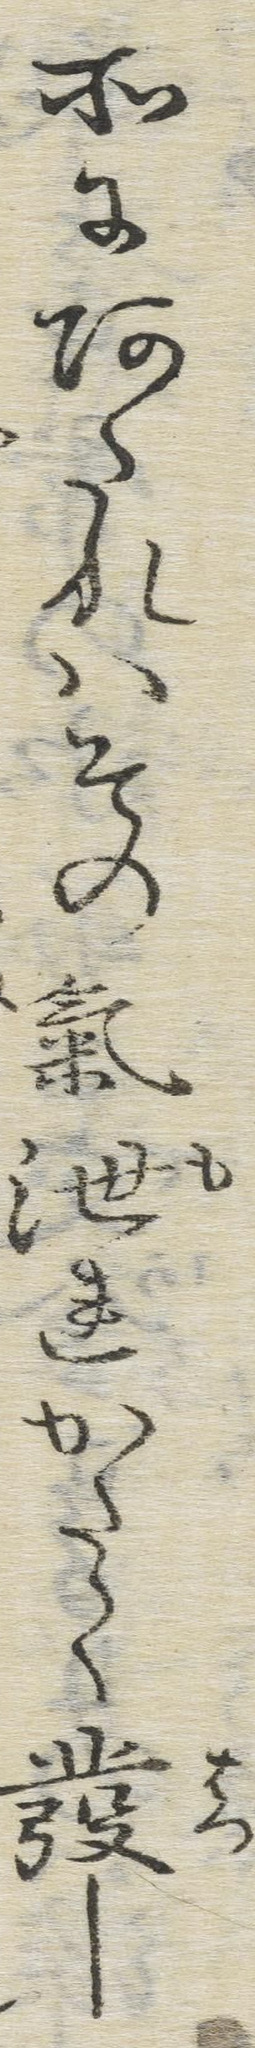所にあたれはその気泄れかたく発し
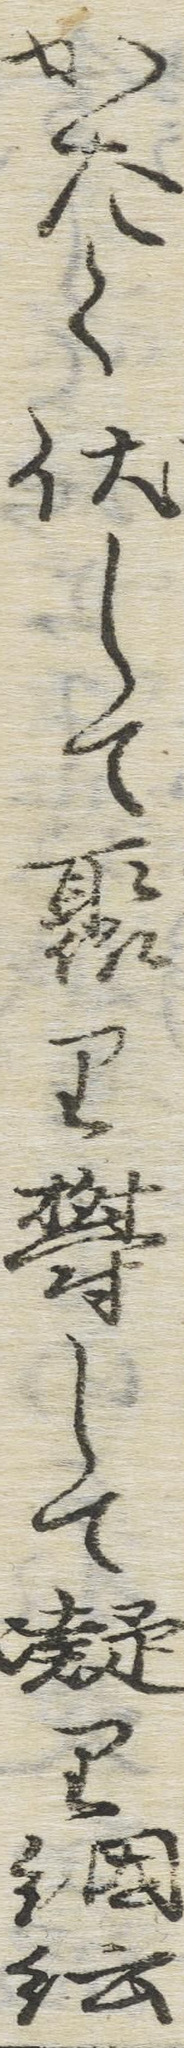かたく伏して聚り欝して凝り絪紜
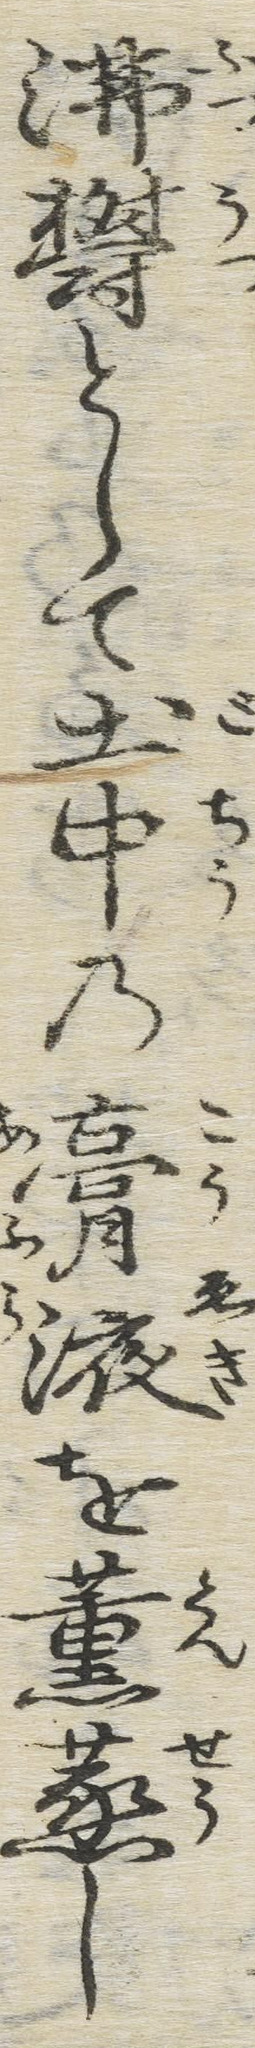沸欝として土中の膏液を薫蒸し
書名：温泉考
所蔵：東京大学地震研究所図書室 Earthquake Research Institute Library, The University of Tokyo, JAPAN
